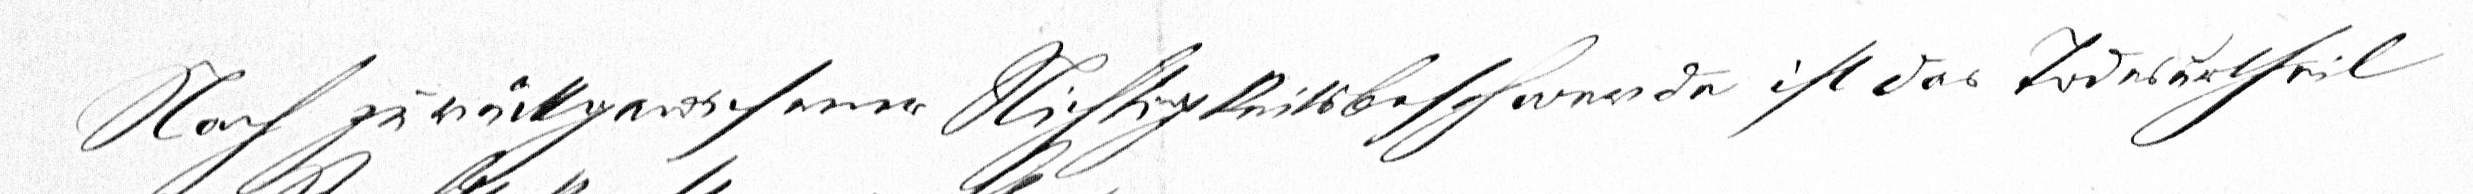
Nach zurückgewichener Nichtigkeitsbeschwerde ist das Todesurtheil
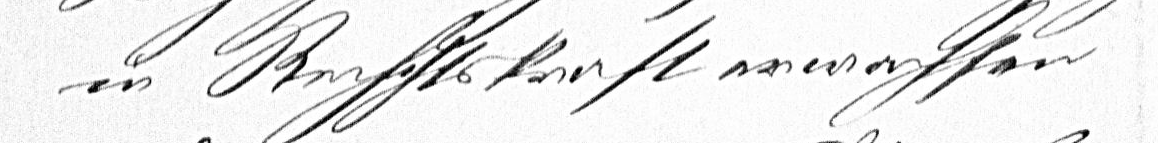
in Rechhtskraft erwachsen
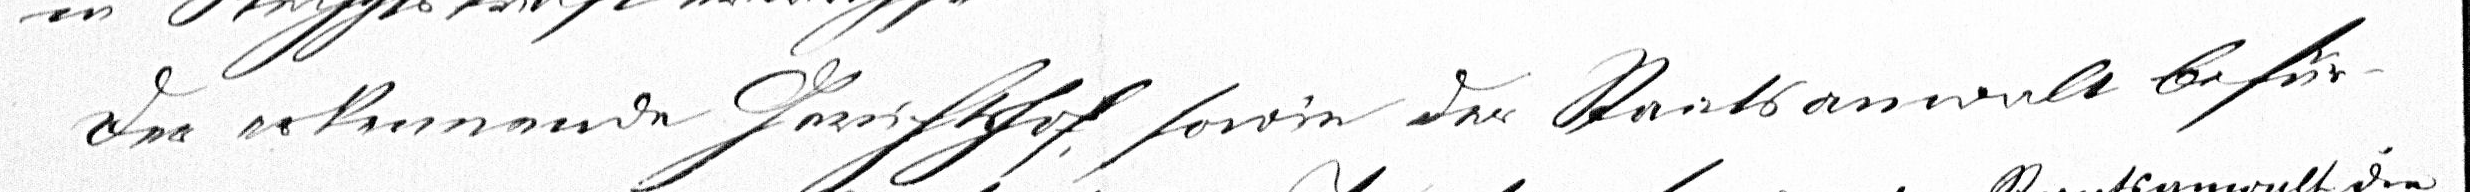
Der erkennende Gerichtshof sowie der Staatsanwalt befür¬
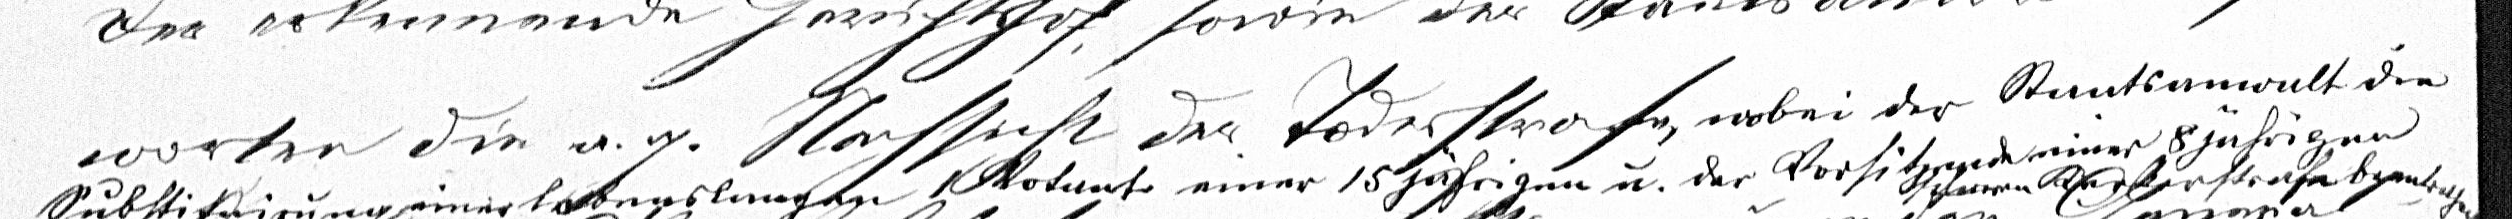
worten die a.g. Nachsicht der Todesstrafe, wobei der Staatsanwalt die
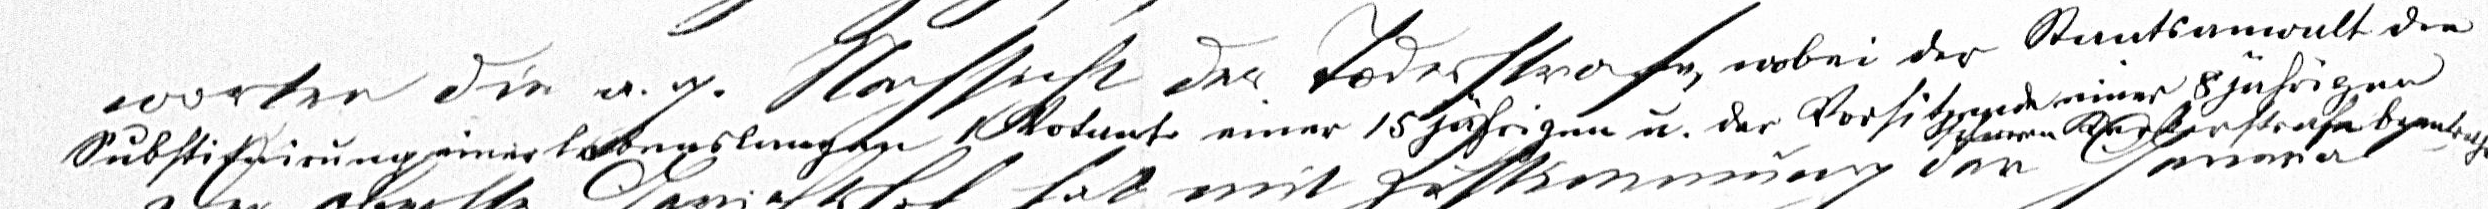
Substituirung einer lebenslangen xxotant einer 15jährigen u. der Vorsitzende einer 8jährigen
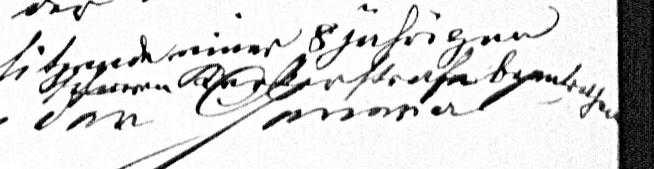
schweren Kerkerstrafe beantragen
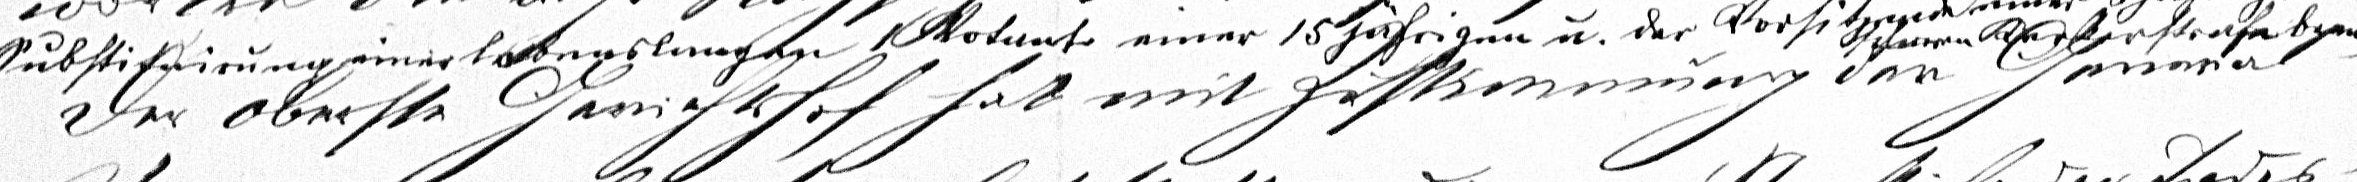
Der oberste Gerichtshof hat mit Zustimmung der General
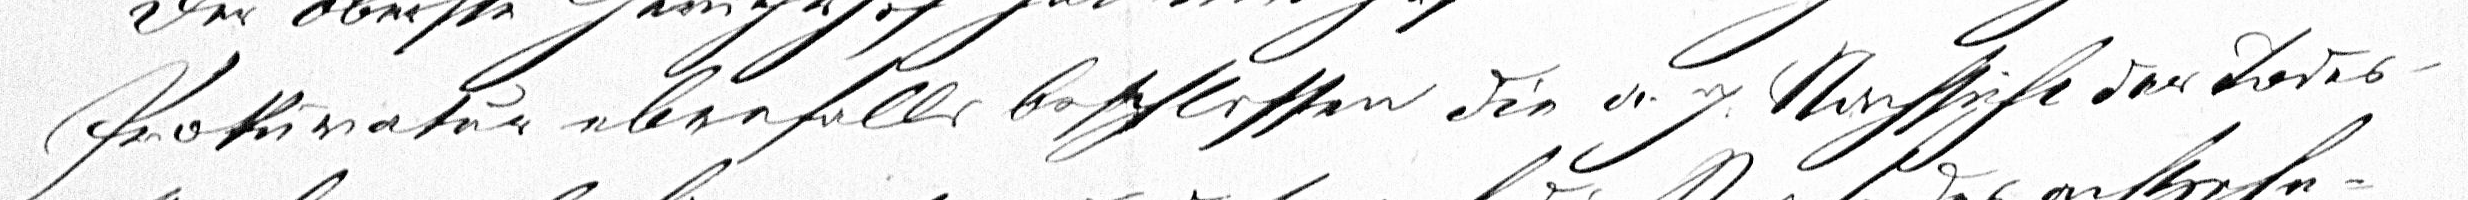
Prokuratur ebenfalls beschlossen die a.g. Nachsicht der Todes¬
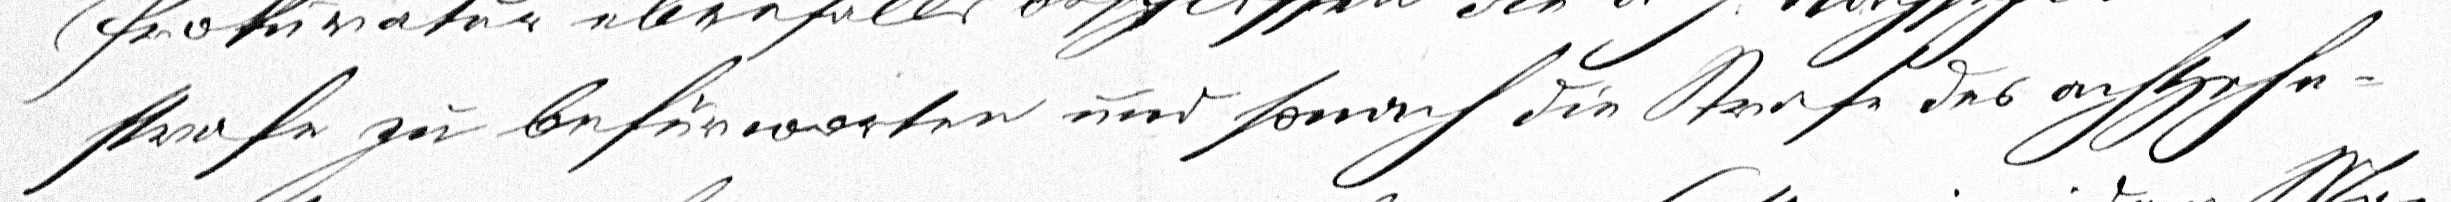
strafe zu befürworten und sonach die Strafe des achtzehn¬
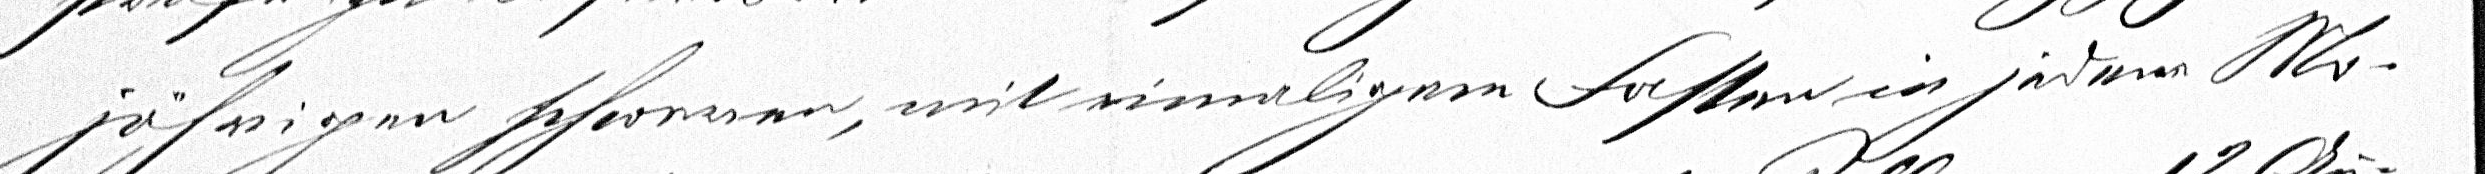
jährigen schweren, mit eimaligem Fasten in jedem Mo¬
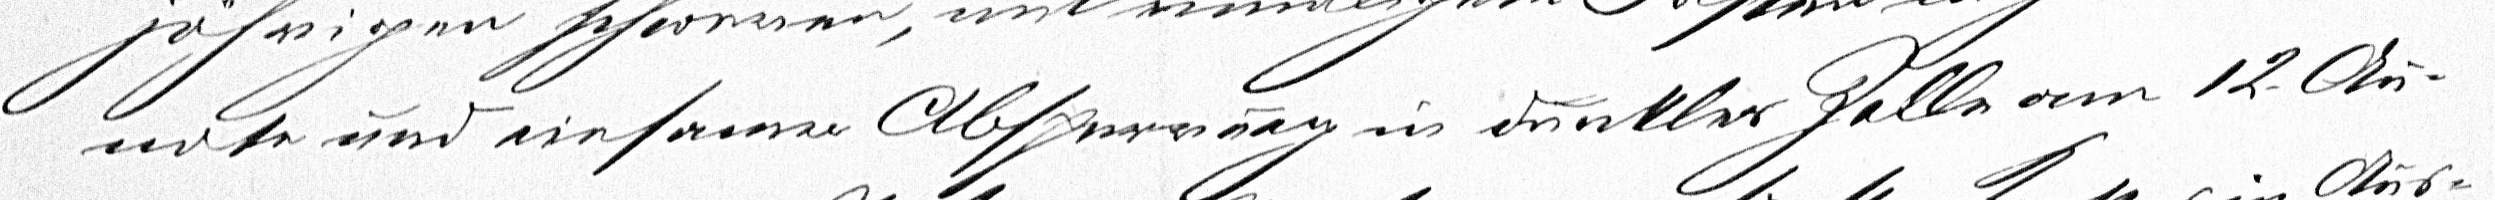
nate und einsamer Absperrung in dunkler Zelle am 12. Au¬
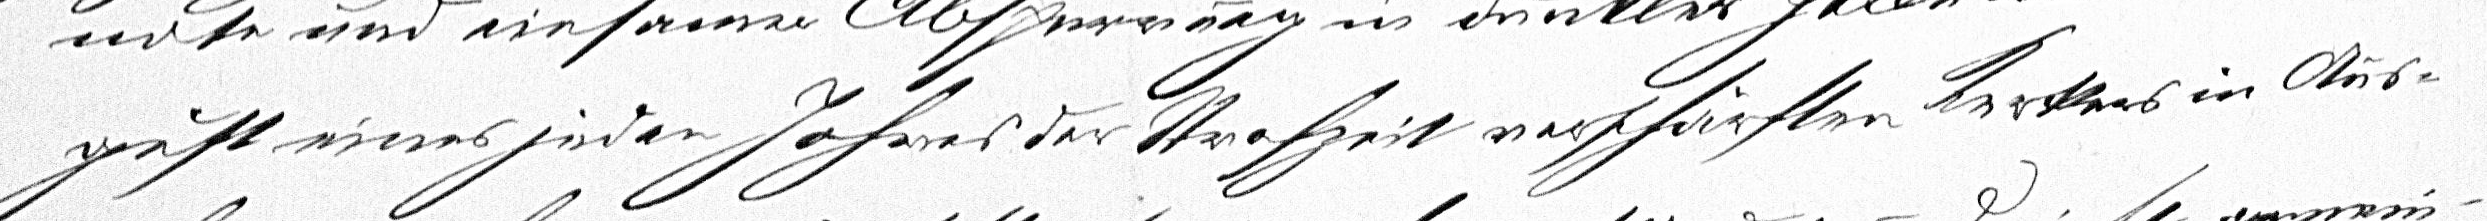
gust eines jeden Jahres der Strafzeit verschärften Kerkers in Au¬
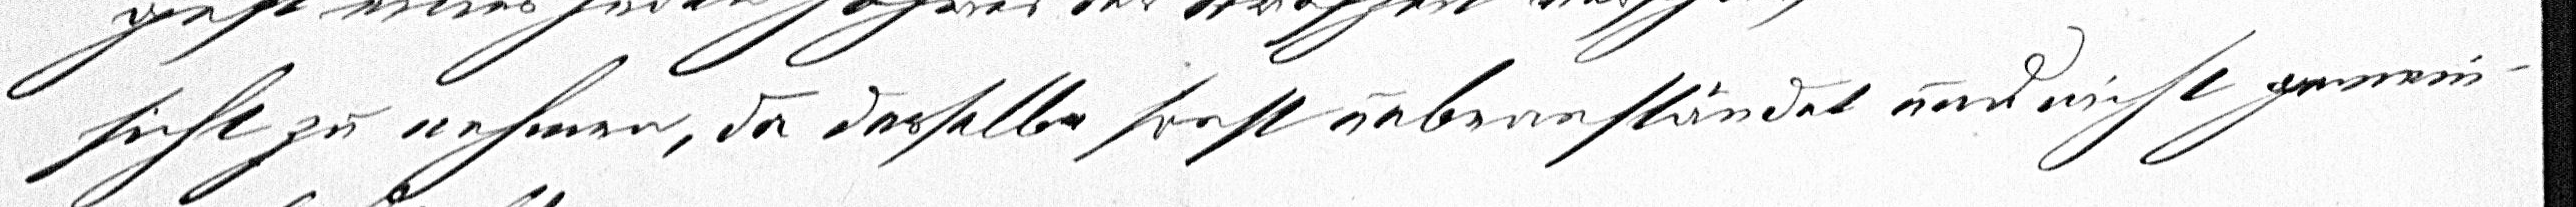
ssicht zu nehmen, da derselbe sonst unbeanständet und nicht gemein¬
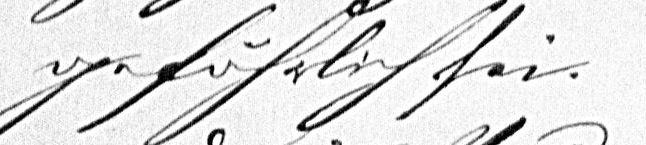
gefährlich sei.
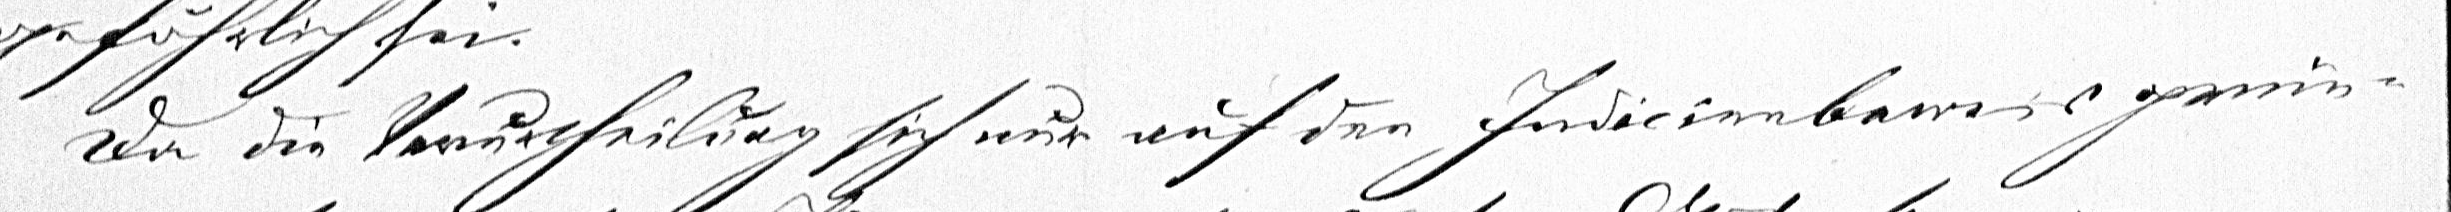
Da die Verurtheilung sich nur auf den Indicienbeweis gerun¬
